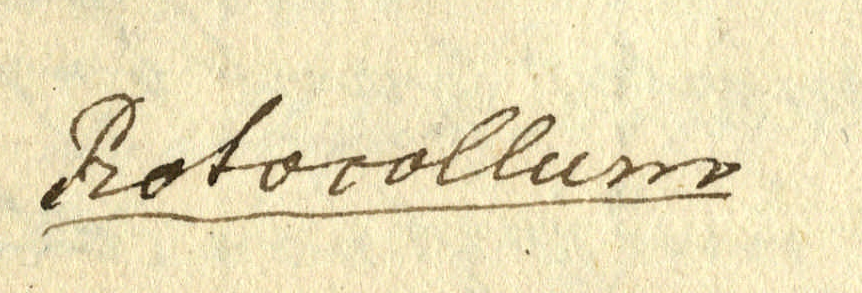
Protocollum
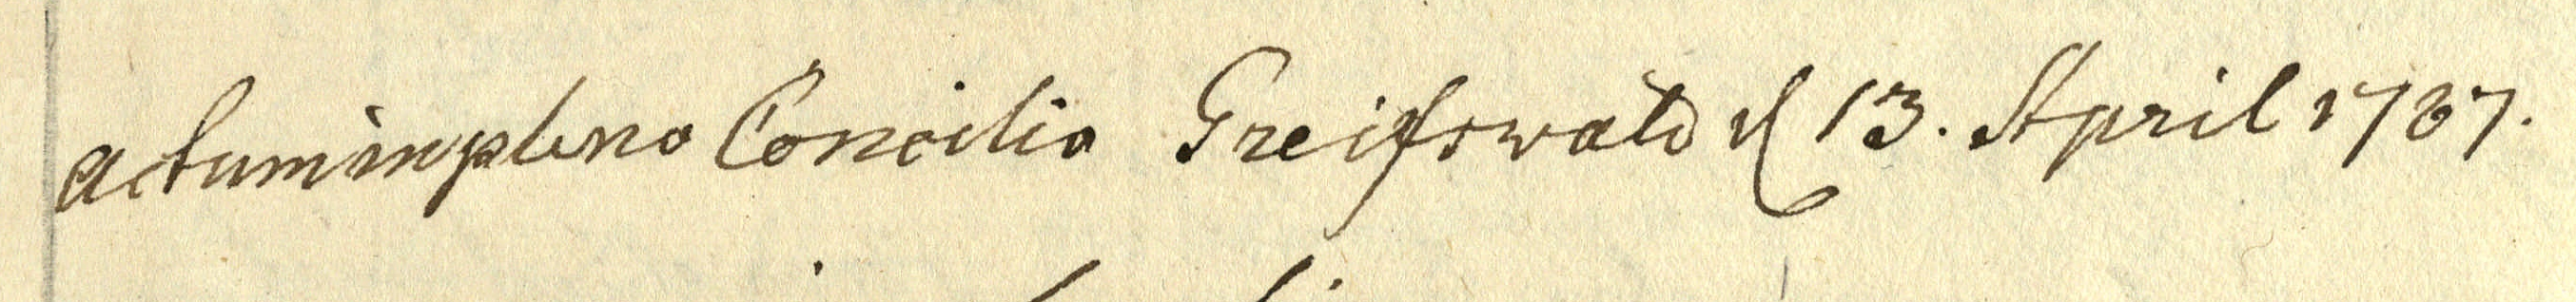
Atum in pleno Concilio Greifswald d 13. April 1787.
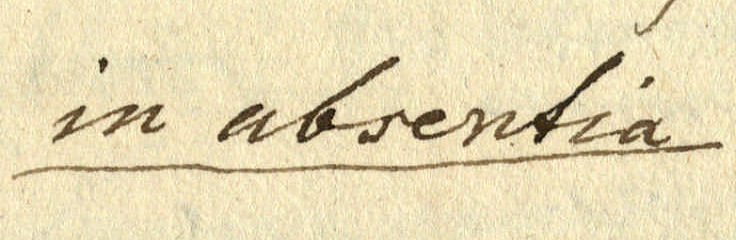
in absentia
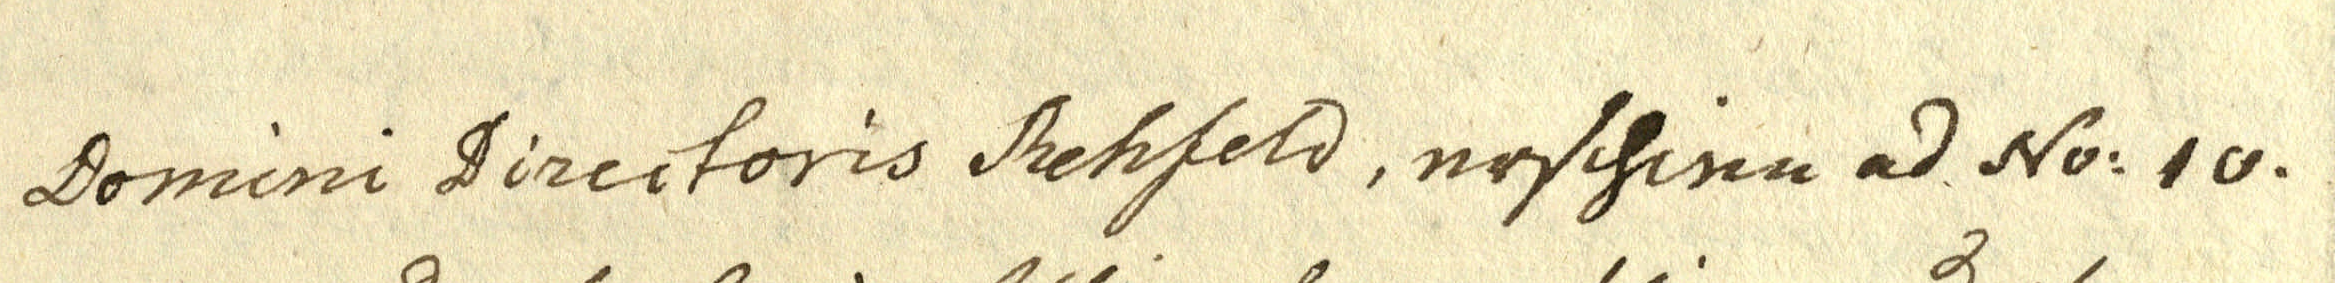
Domini Directoris Rehfeld, erscheinen ad No. 1 c.
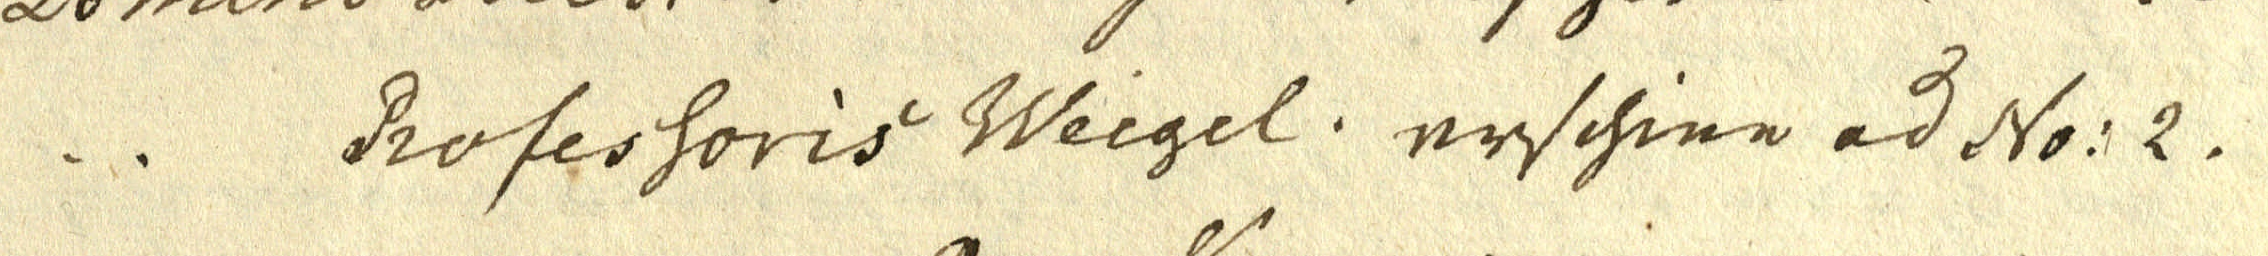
Professoris Weigel erscheinen ad No 2.
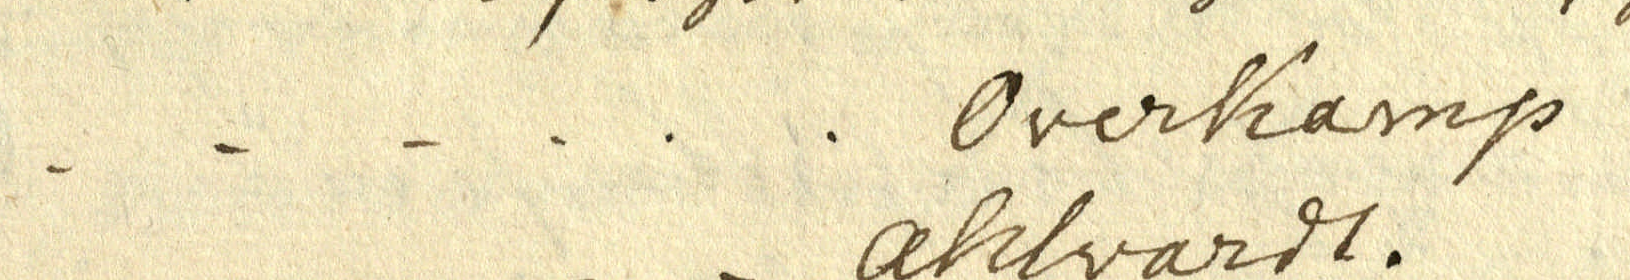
Overkamp
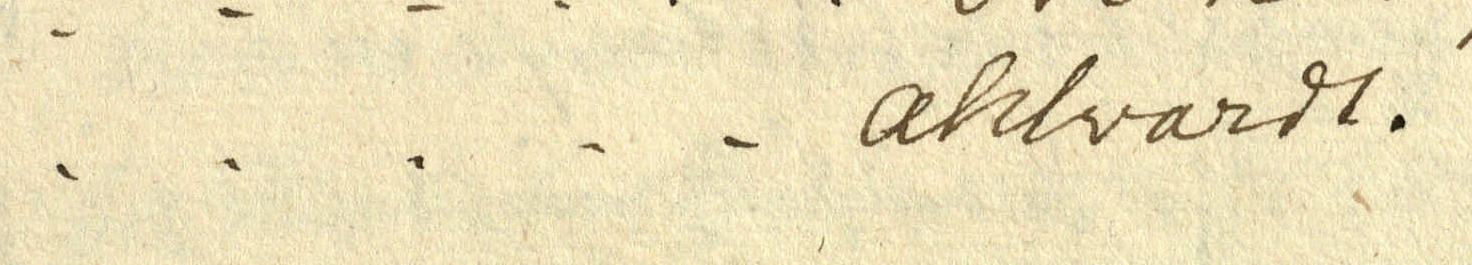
Ahlwardt.
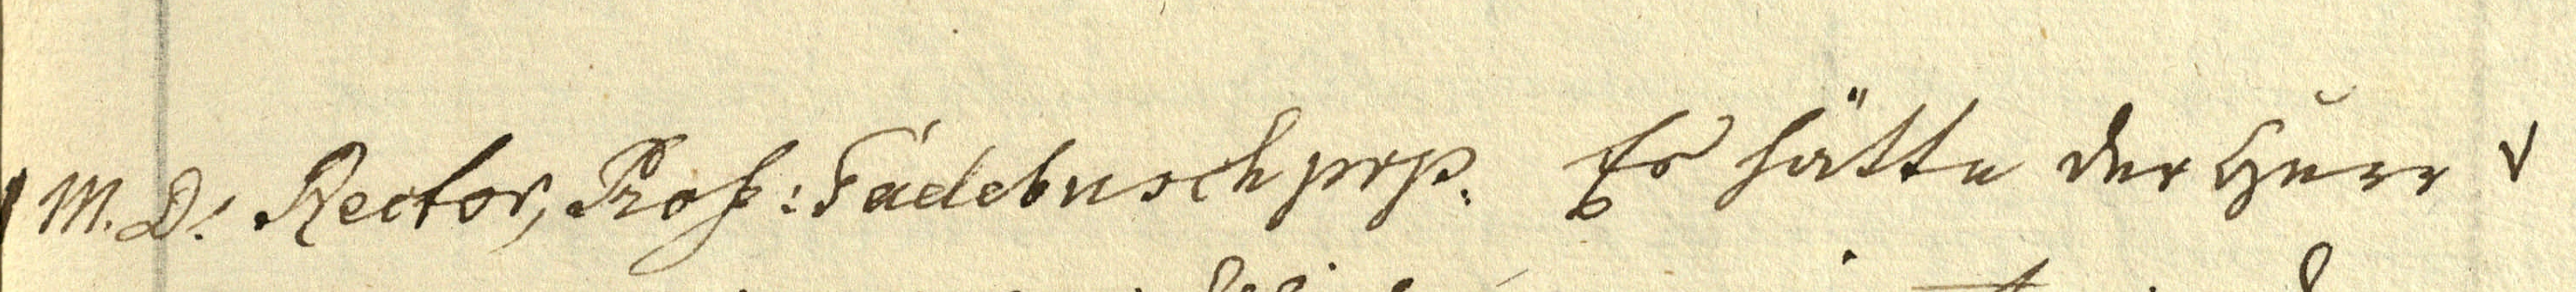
M. D. Rector Prof. Gadebusch prp. Es hätte der Herr
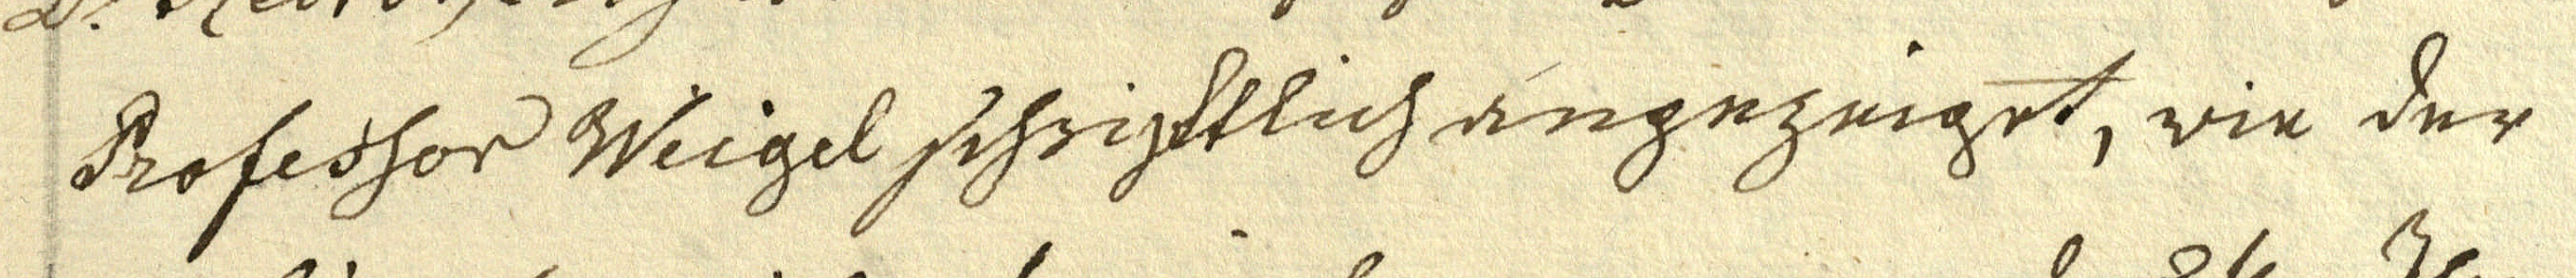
Professor Weigel schriftlich angezeiget, wie der
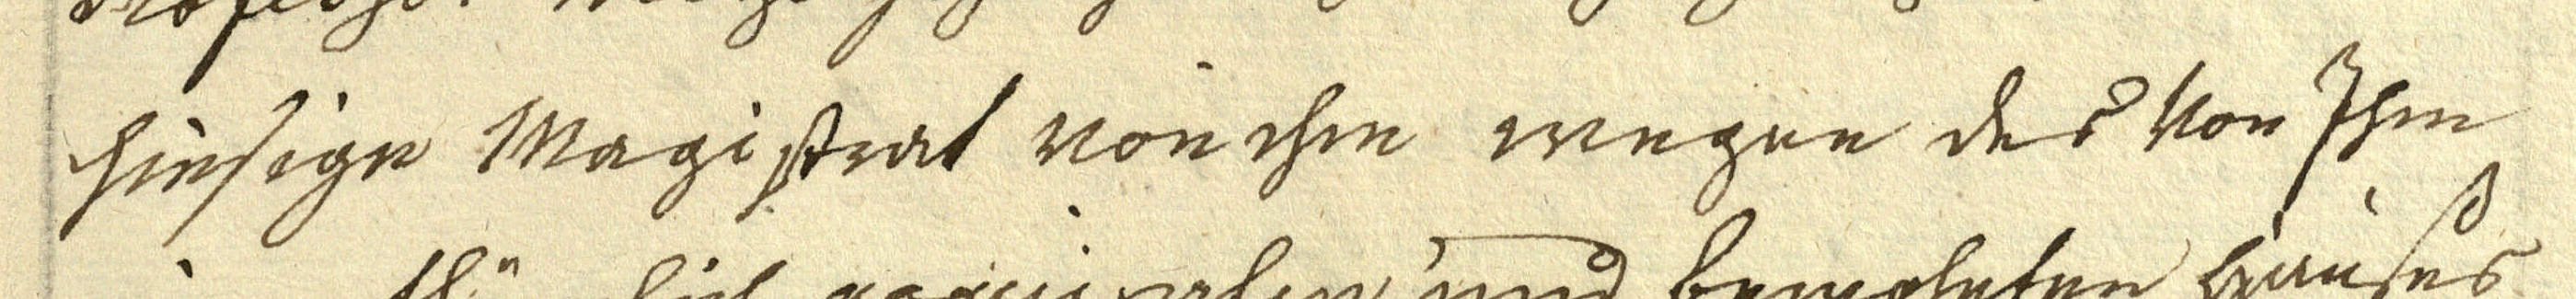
hiesige Magistrat von ihm wegen des vor Ihm
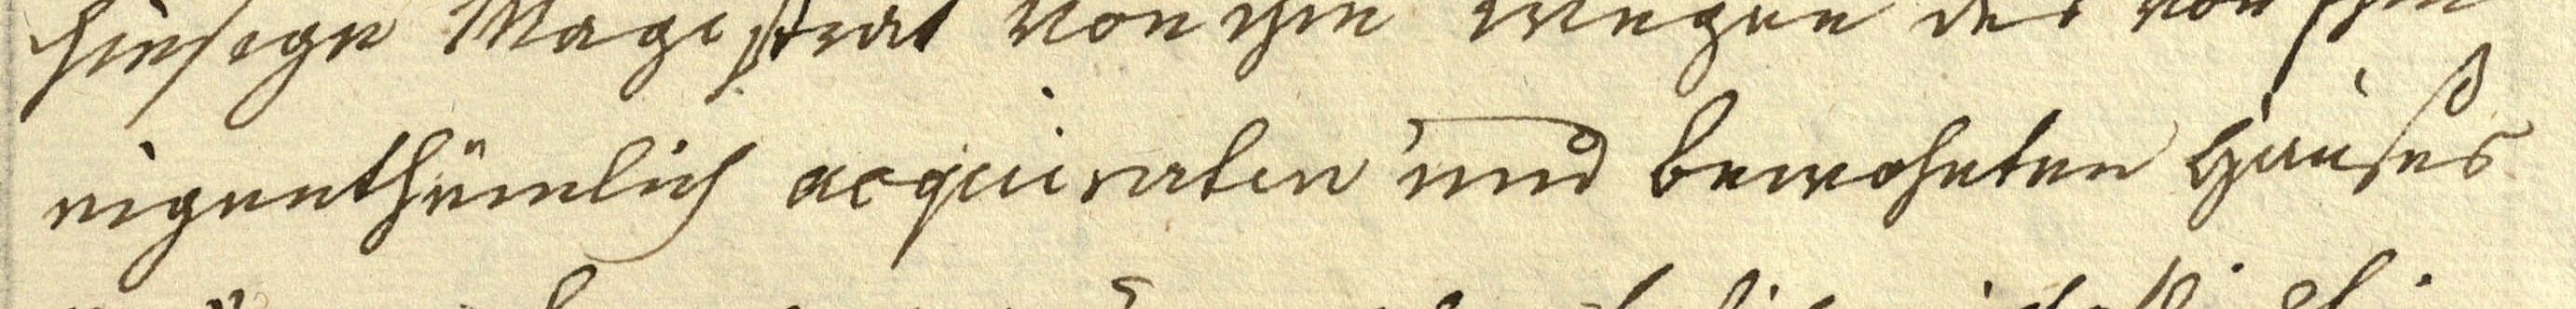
eigenthümlich acquirirten und bewohnten Hauses
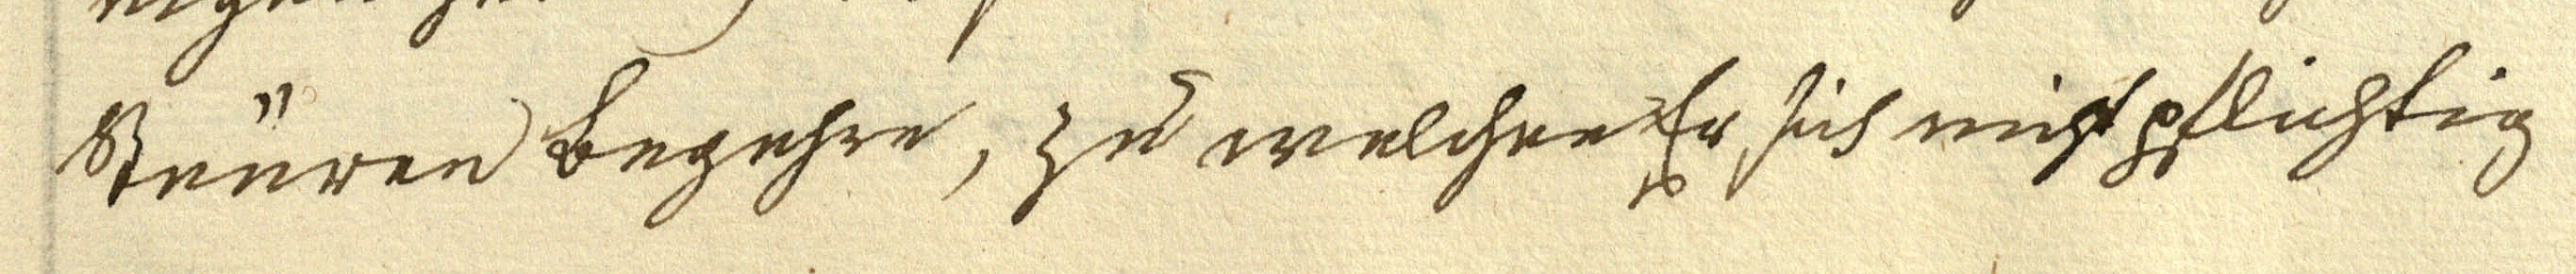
Steuren begehre, zu welchen Er sich nicht pflichtig
